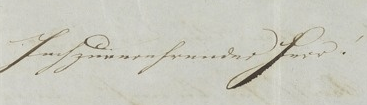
Hochzuverehrender Herr!
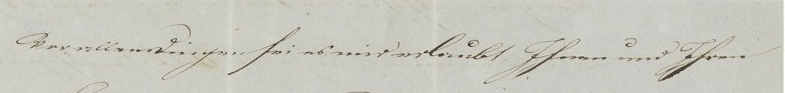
Vor allen Dingen sei es mir erlaubt, Ihnen und Ihren
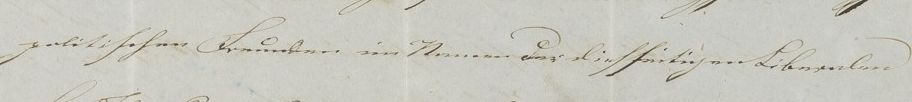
politischen Freunden im Namen der diesseitigen Liberalen
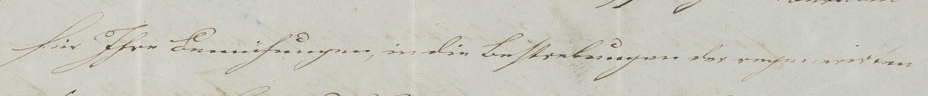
für Ihre Bemühungen, in die Bestrebungen der reformierten
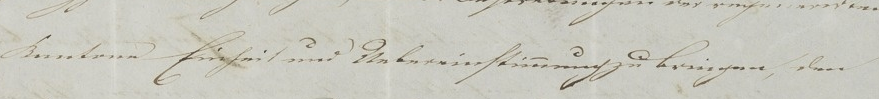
Kantone Einheit und Uebereinstimmung zu bringen, den
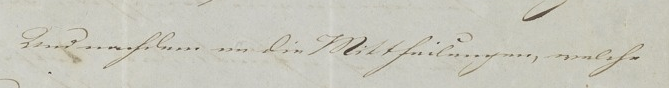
Und nachdem an die Mittheilungen, welche
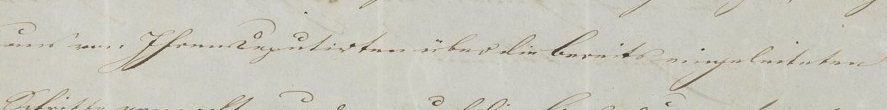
uns von Ihren Deputirten über die bereits eingeleiteten
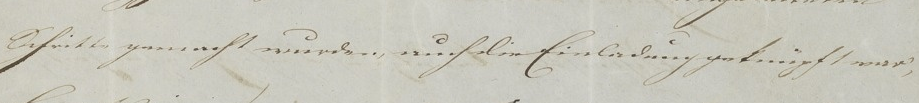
Schritte gemacht wurden, auch die Einladung geknüpft war,
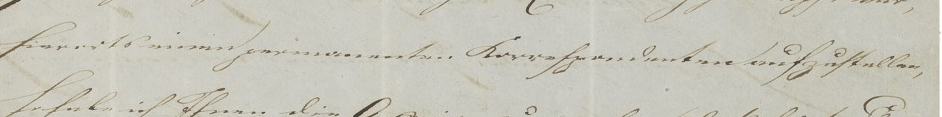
hieorts einen permanenten Korrespondenten aufzustellen,
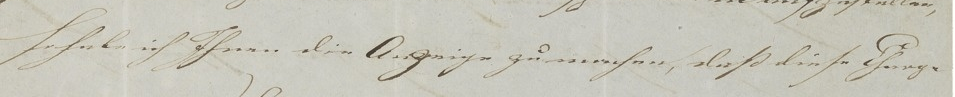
so habe ich Ihnen die Anzeige zu machen, daß diese Charge
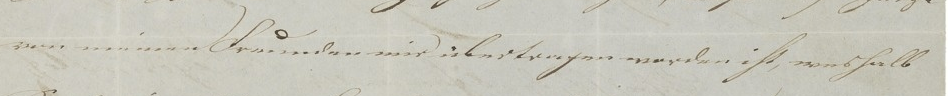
von meinen Freunden mir übertragen worden ist, weshalb
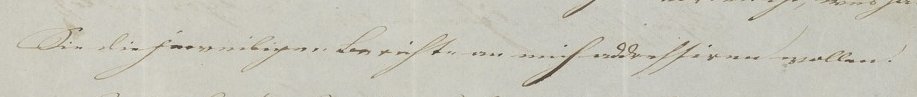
Sie die jeweiligen Berichte an mich addressiren wollen.
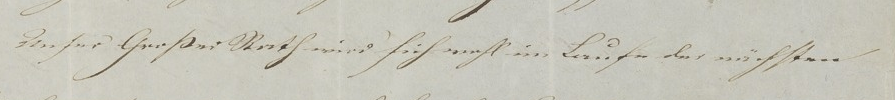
Unser Großer Rath wird sich wohl im Laufe der nächsten
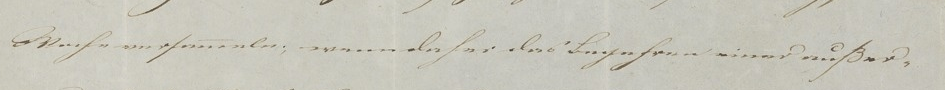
Woche versammeln; wenn daher das Begehren einer außer-
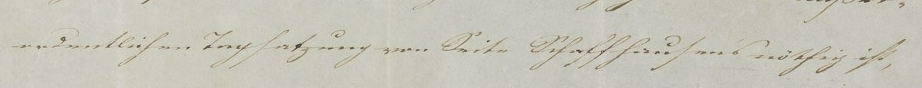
ordentlichen Tagsatzung von Seite Schaffhausens nöthig ist,
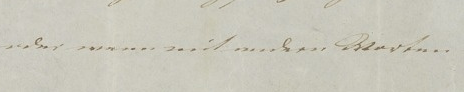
oder wenn mit andern Worten
